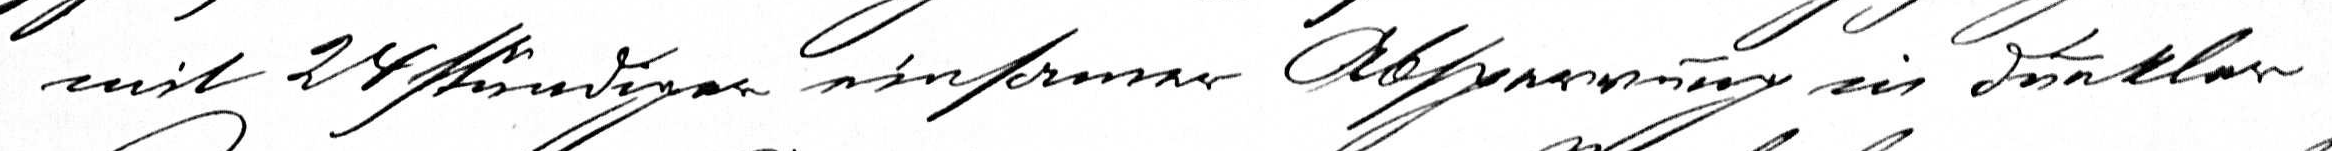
mit 24 ständiger einsamer Absperrung in dunkler
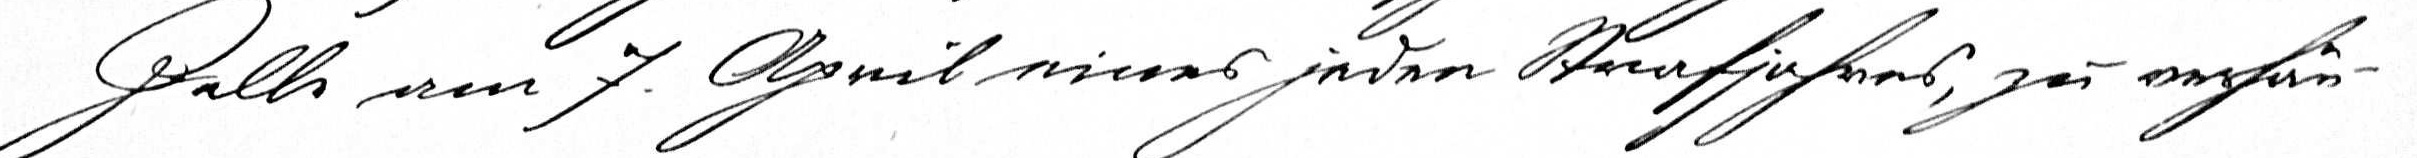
Zelle am 7. April eines jeden Strafjahres, zu verhän¬
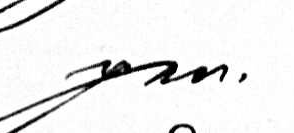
gen.
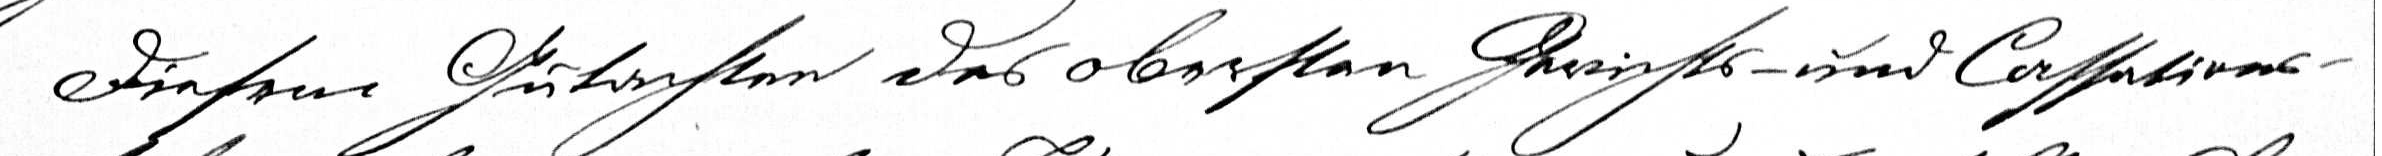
Diesem Gutachten des obersten Gericht- und Cassations¬
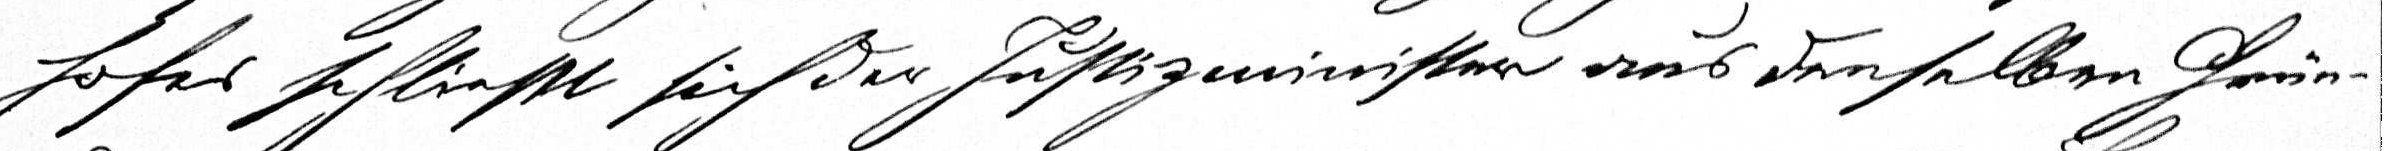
hofes schließt sich der Justizminister aus denselben Grün¬
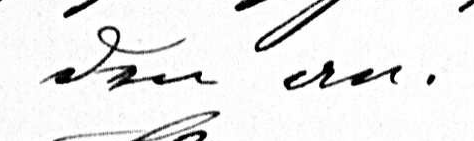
den an.
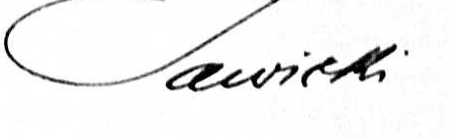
Sawicki
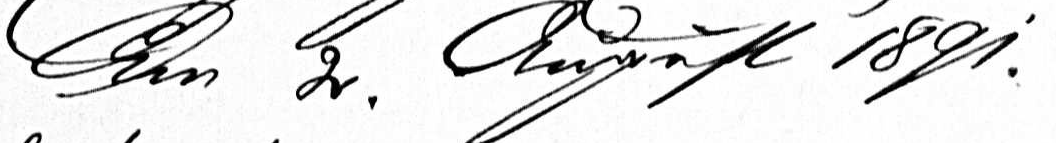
Am 2. August 1891.
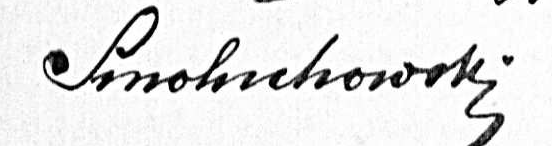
Smolnchowcki
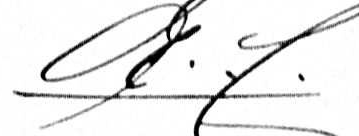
A. E.
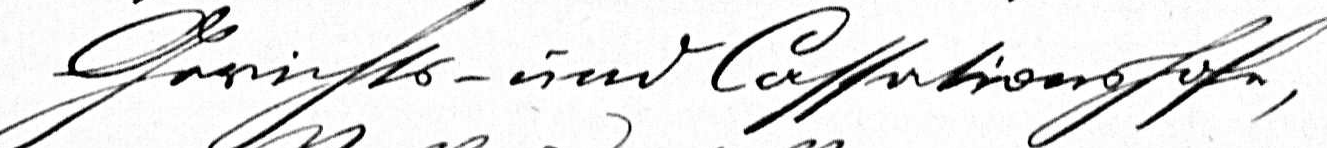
Gericht- und Cassationshofe,
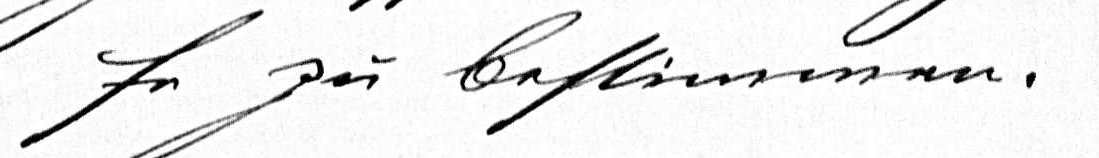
fe zu bestimmen.
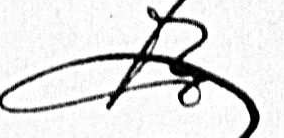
FJ
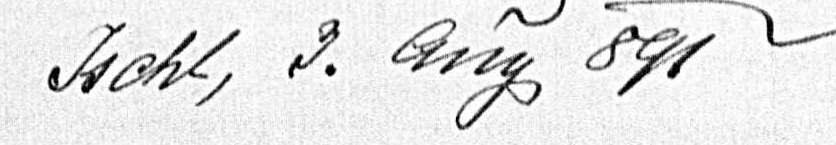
Jscht, 3. Aug 891
